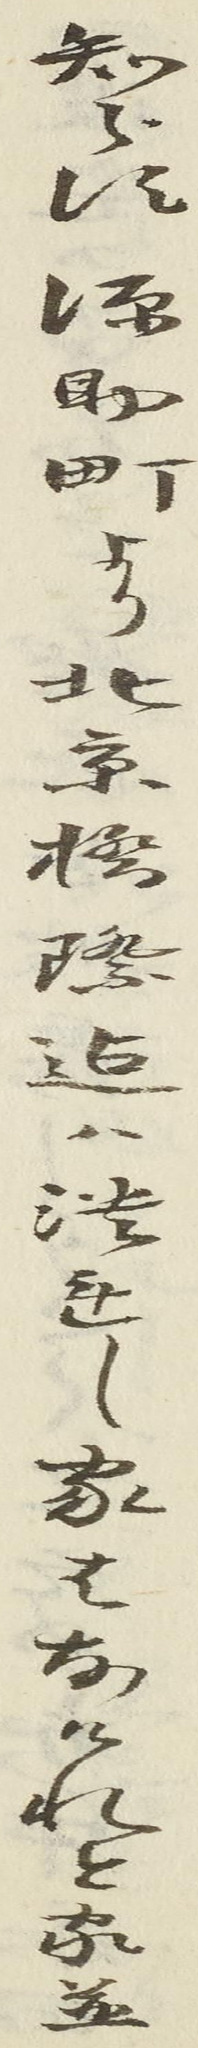知らす源助町より北京橋際迄ハ潰れし家はなけれと家並
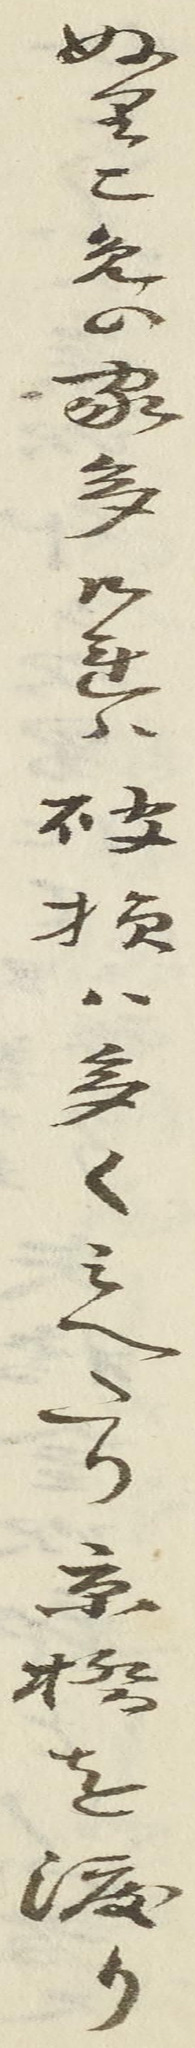ぬりこめの家多けれハ破損ハ多くミへたり京橋を渡り
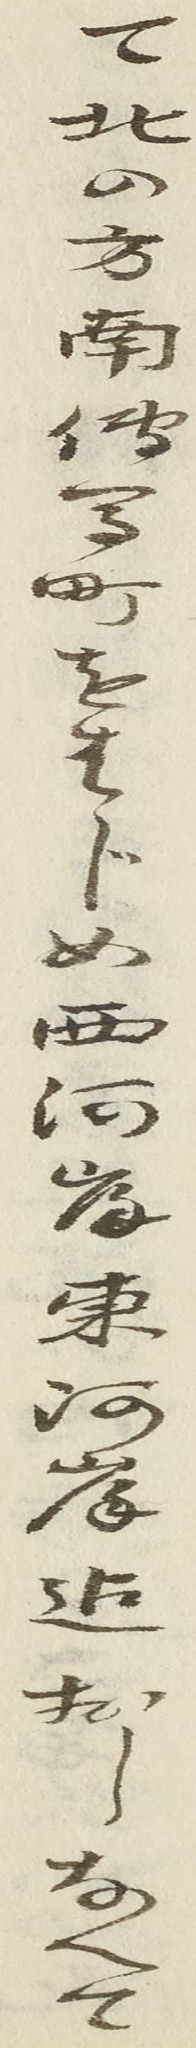て北の方南傳馬町をはしめ西河岸東河岸迄おしなへて
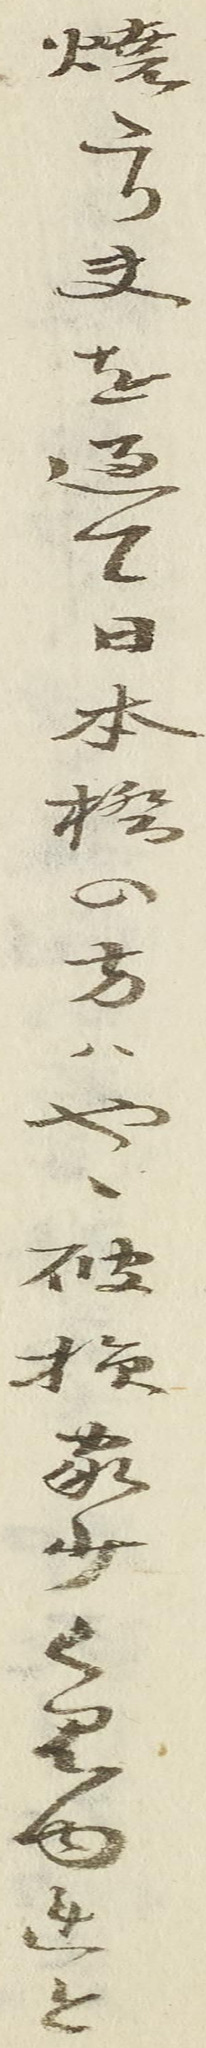焼たり夫を過て日本橋の方ハやゝ破損家少て見ゆれと
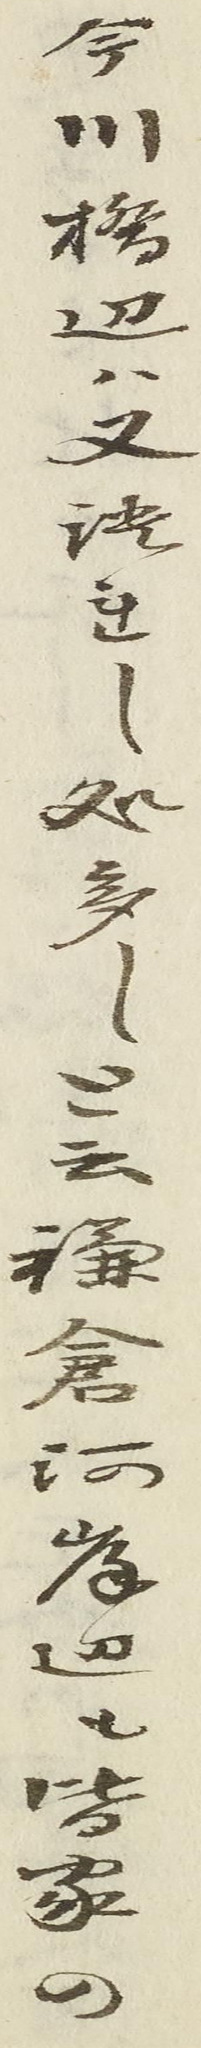今川橋辺ハ又潰れし処多しと云鎌倉河岸辺も皆家の
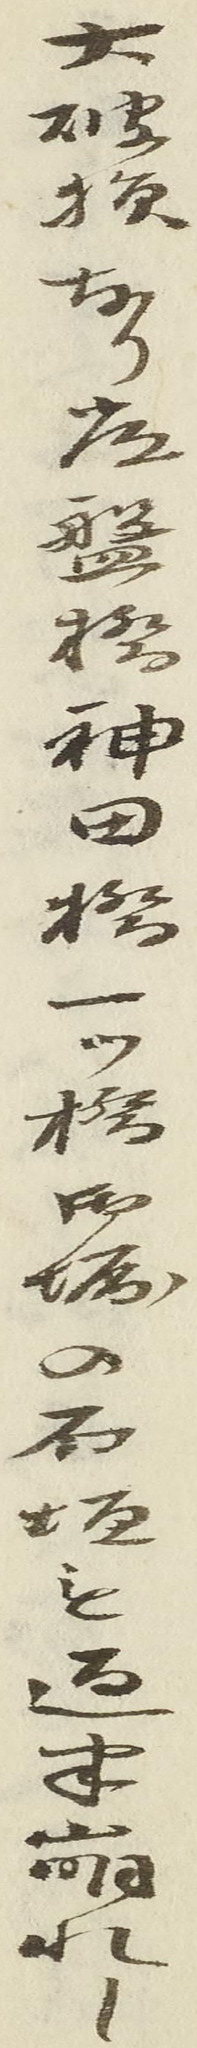大破損なり常盤橋神田橋一ッ橋御堀の石垣も過半崩れし
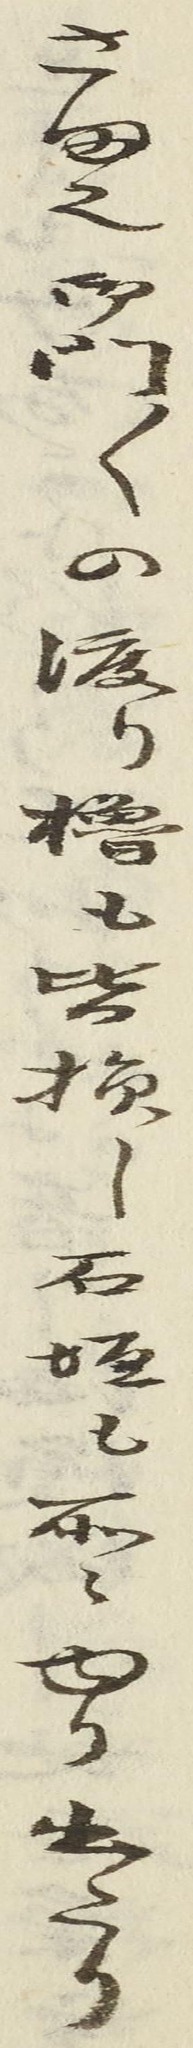さま也御門〳〵の渡り櫓も皆損し石垣も所々ゆり出たり
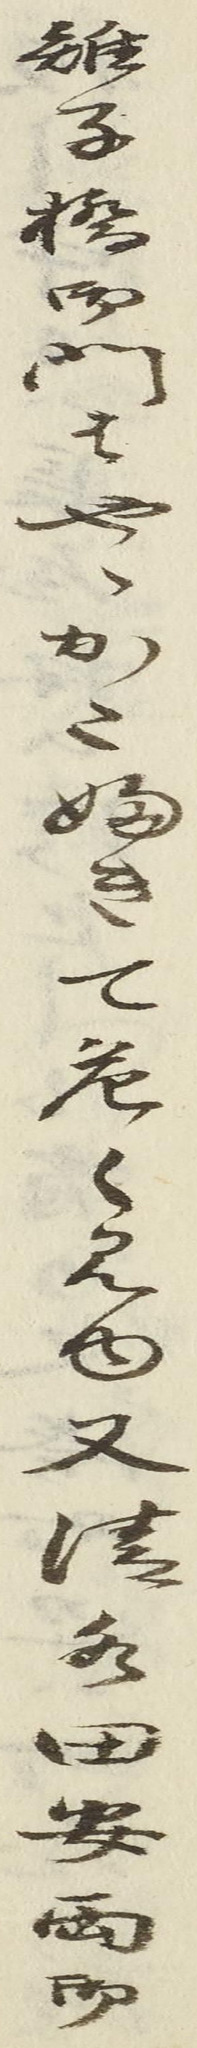雉子橋御門はやゝかたふきて危くみゆ又清水田安両御
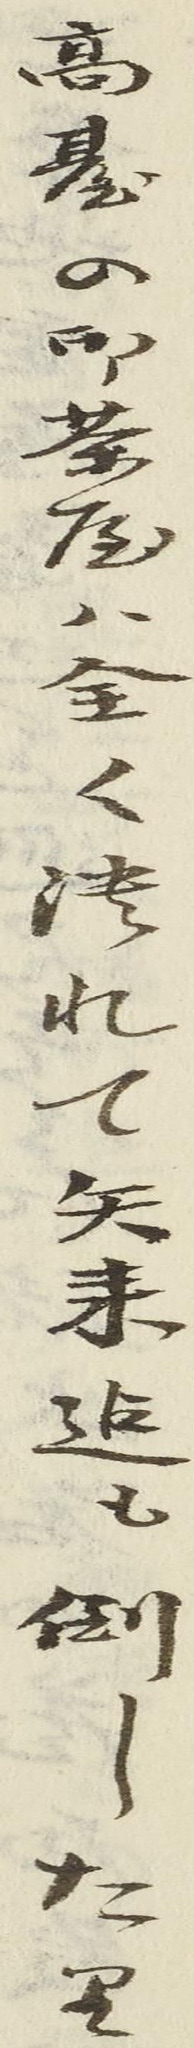高台の御茶屋ハ全く潰れて矢来迄も倒したり
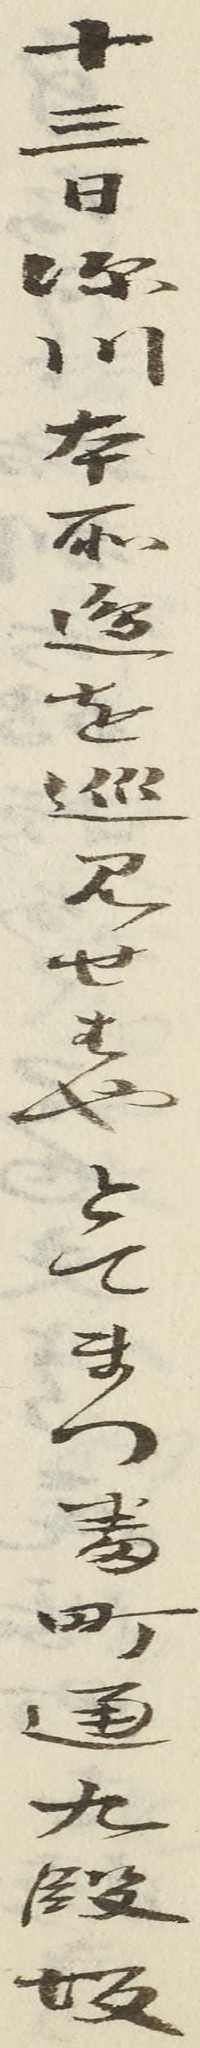十三日深川本所辺を巡見せはやとてまつ番町通九段坂
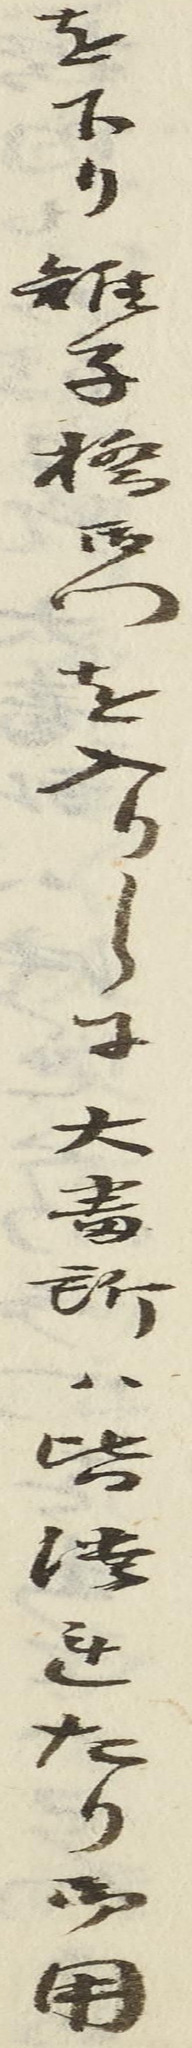を下り雉子橋御門を入りしに大番所ハ皆潰れたり御用
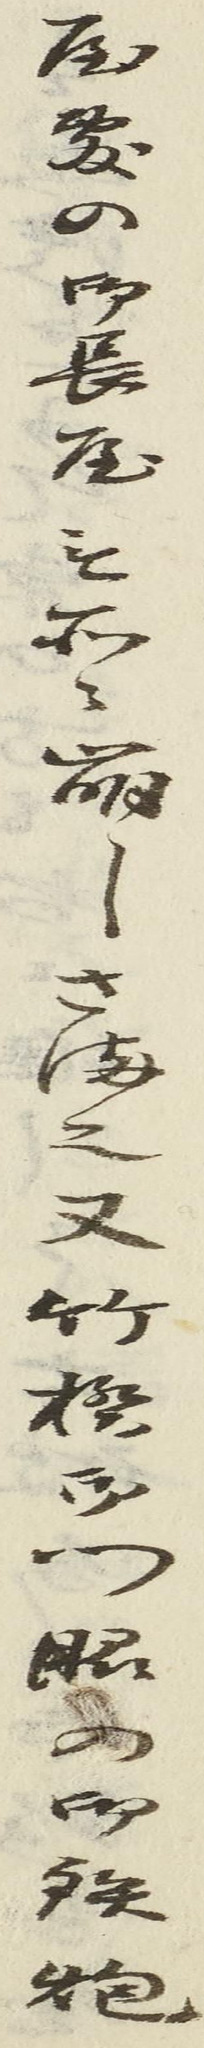屋敷の御長屋も所々崩しさま也又竹橋御門脇の御鉄炮
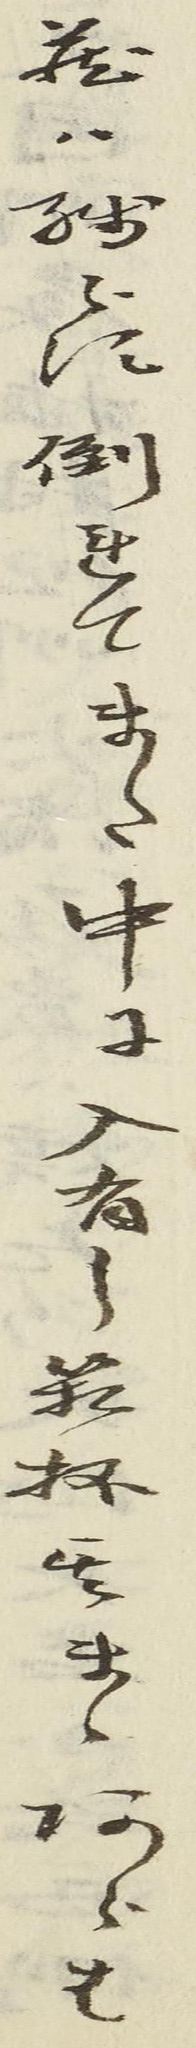蔵ハ残らす倒れてまた中に入有し箱抔其まゝあらは
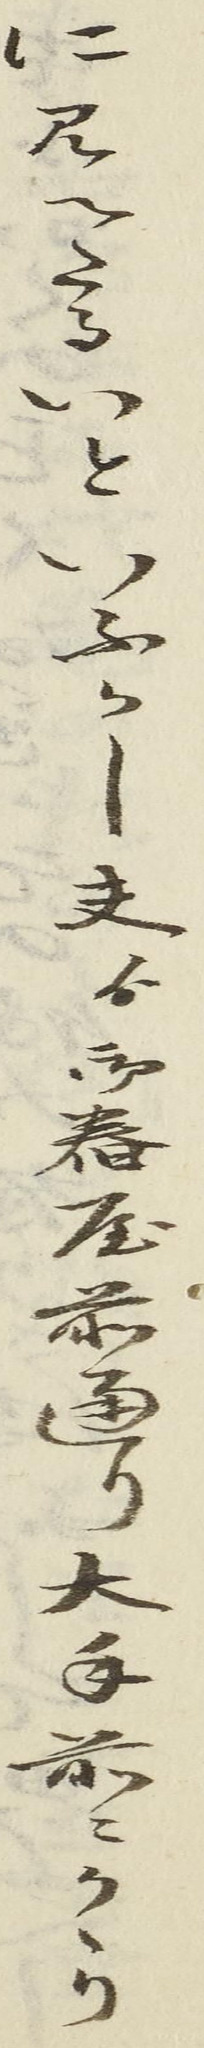に見へたるいといふかし夫ゟ御舂屋前通り大手前二かゝり
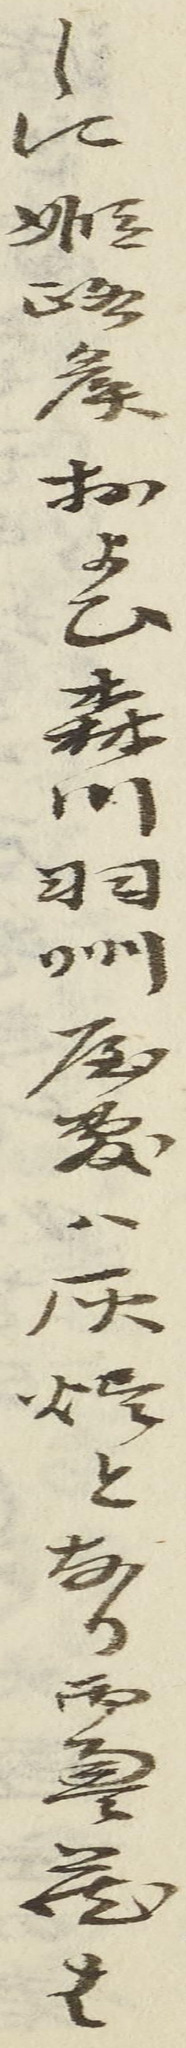しに姫路矦およひ森川羽州屋敷ハ灰燼となり御畳蔵は
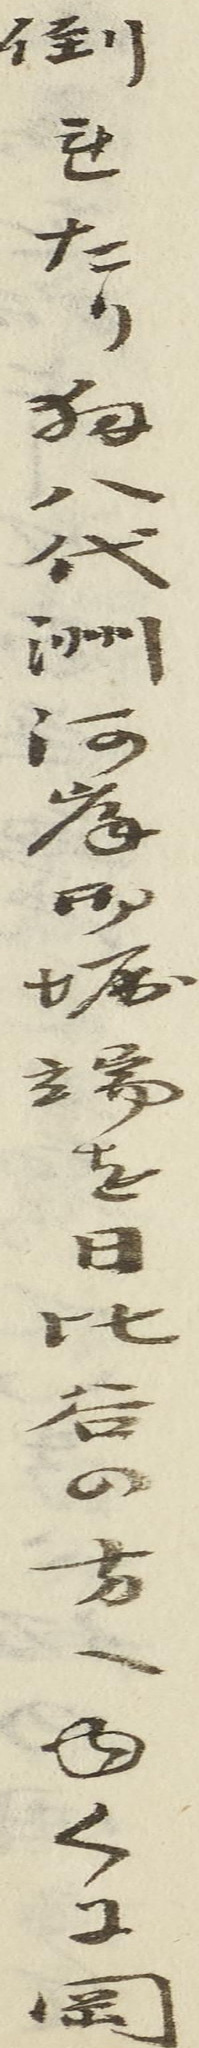倒れたり猶八代洲河岸御堀端を日比谷の方へゆくに岡
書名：那為の後見艸　全
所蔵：東京大学地震研究所図書室 Earthquake Research Institute Library, The University of Tokyo, JAPAN
